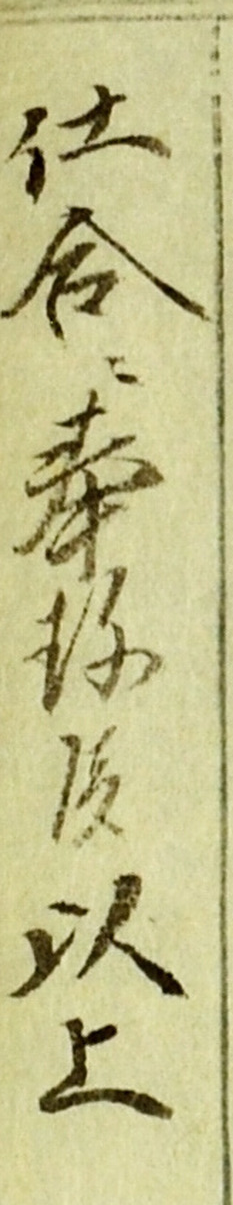仕合ニ奉存候以上
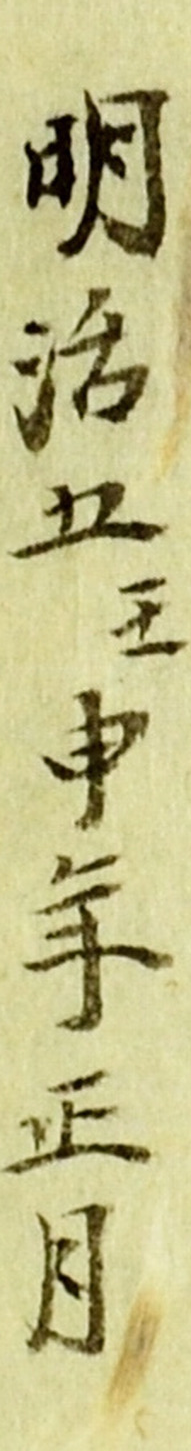明治五壬申年正月
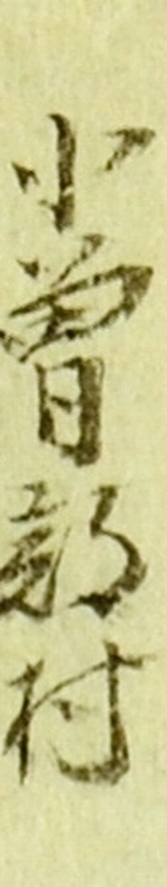小曽部村

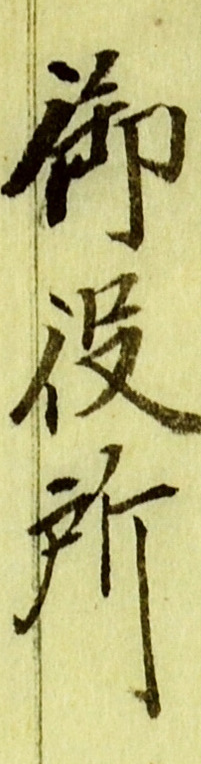御役所

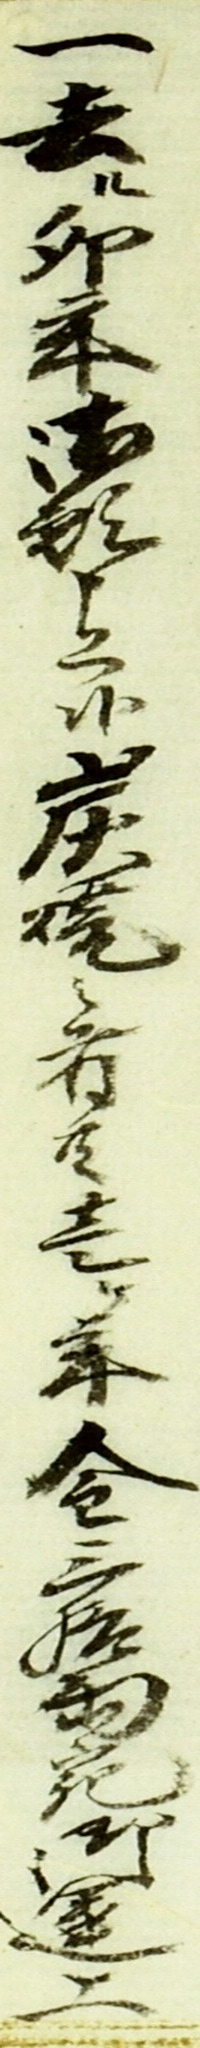一去ル卯年御願申上候炭焼之者共壱ケ年金三拾両宛御運上
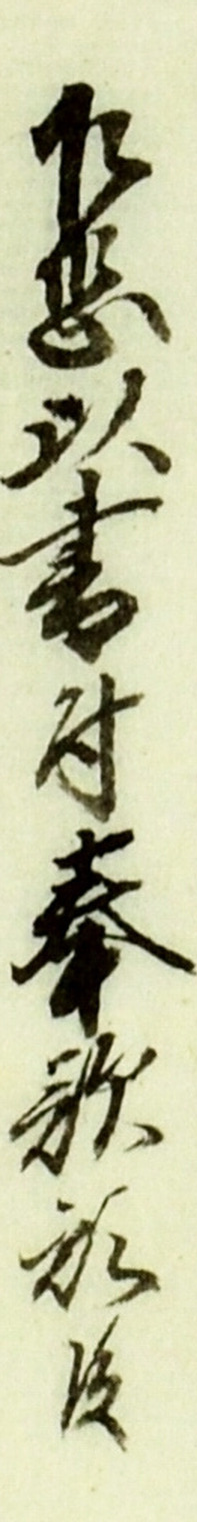乍恐以書付奉歎願候
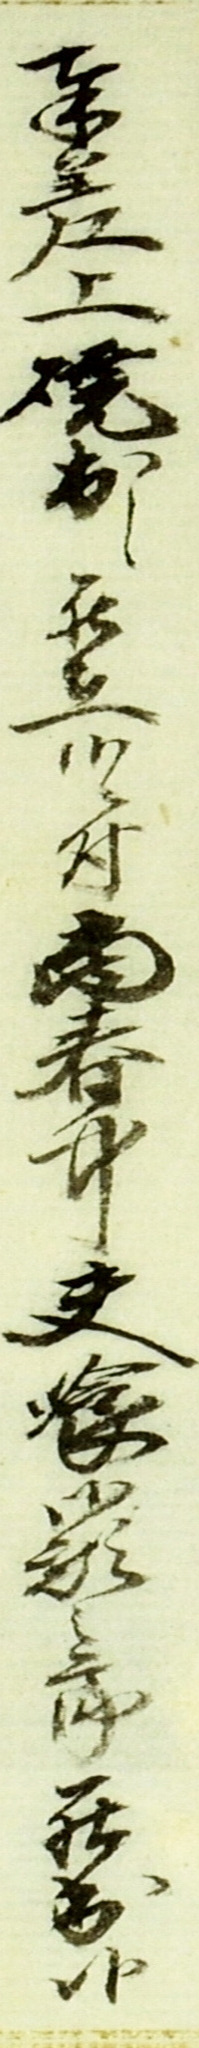奉差上焼出し罷在候ニ付当春中夫喰御願之節罷出候
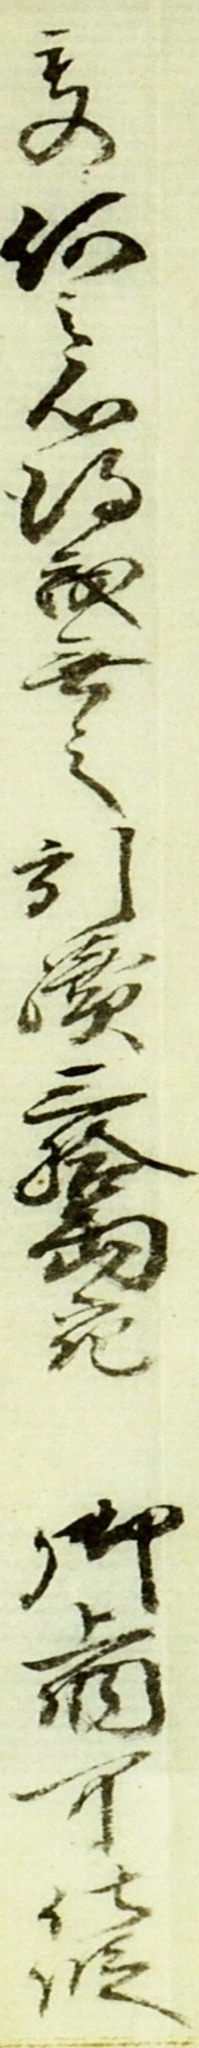もの何之心得茂無之引続三拾両宛御上納可仕段
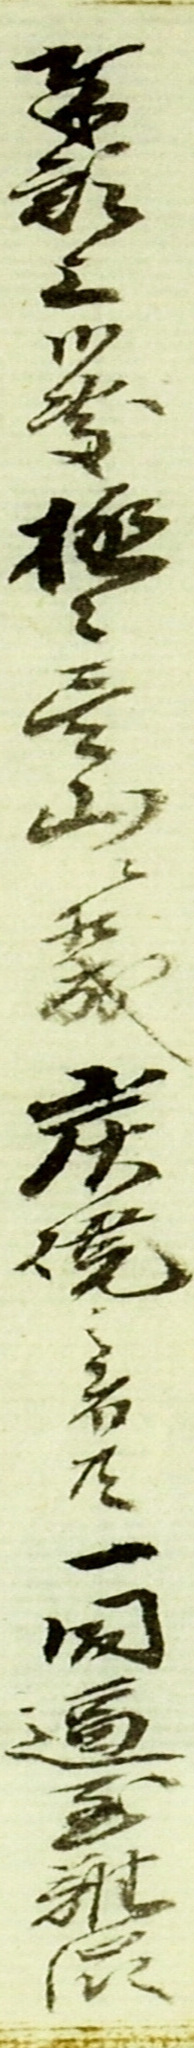奉願上候処極々尽山ニ相成炭焼之者共一同ひっ逼迫難渋
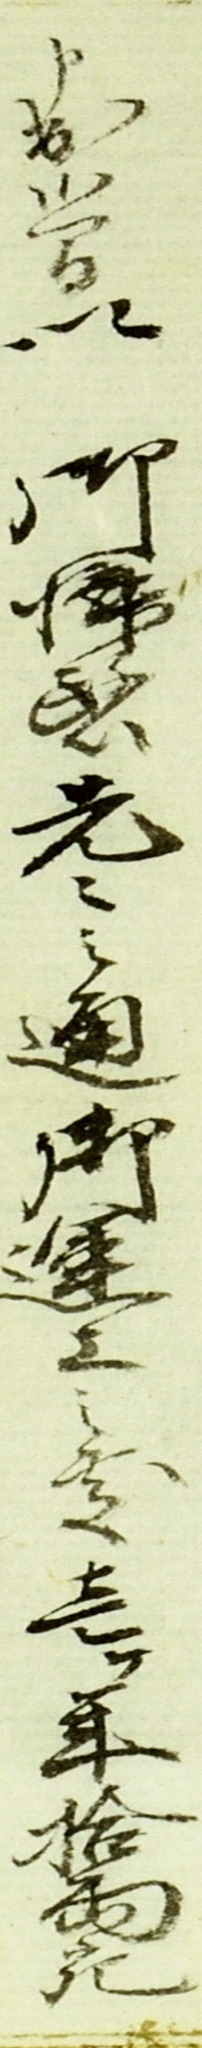申出候間以御憐愍先々之通御運上之処壱ケ年拾両宛
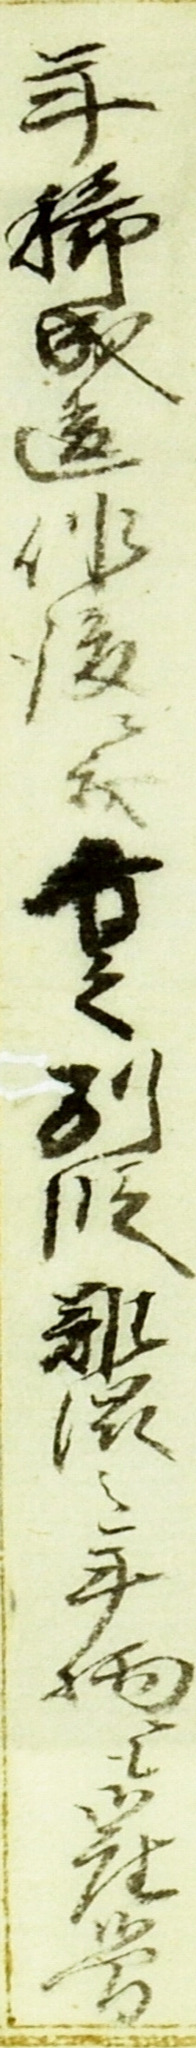年稀成違作後ニ茂有之別段難渋之年柄ニも御座候間
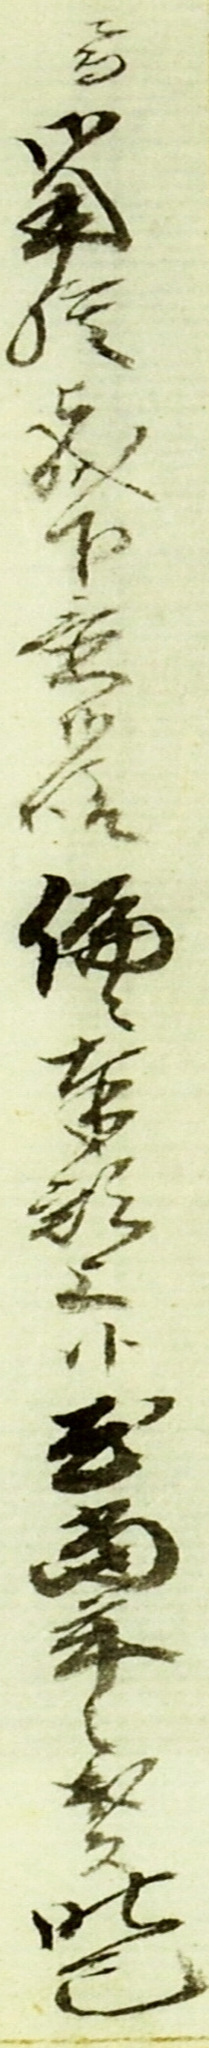ニ而御用捨被成下置候様偏ニ奉願上候尤当年之義者昨巳

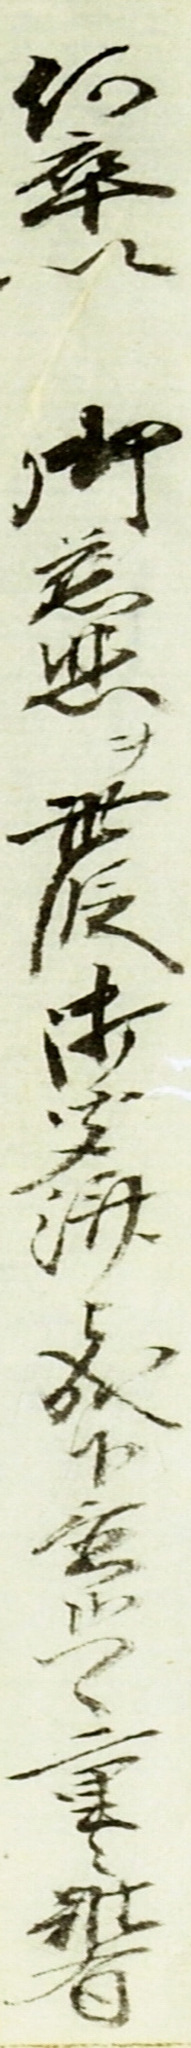何卒以御慈悲ヲ此段御聞済被成下置候ハゝ重々難有
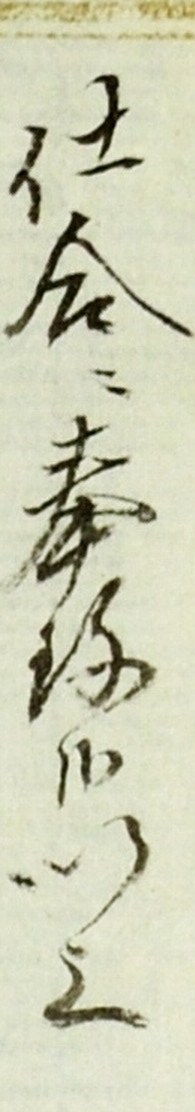仕合ニ奉存候以上
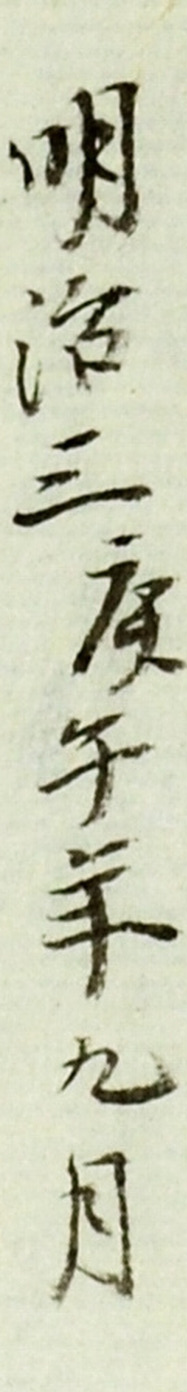明治三庚午年九月
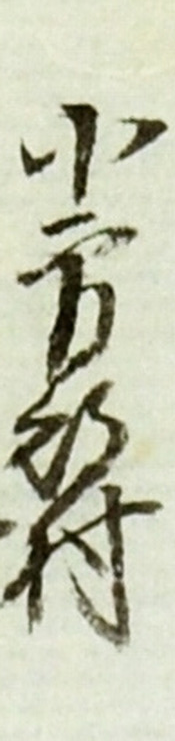小曽部村
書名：乍恐以書付奉嘆願候
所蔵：伊那市立高遠町図書館・合同会社AMANE
